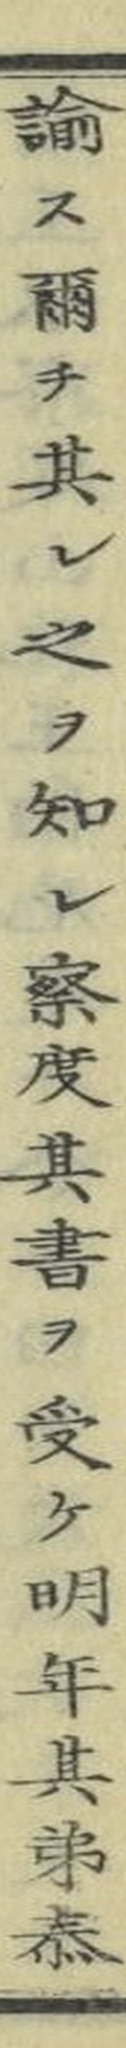論ス爾チ其レ之ヲ知レ察度其書ヲ受ケ明年其弟泰
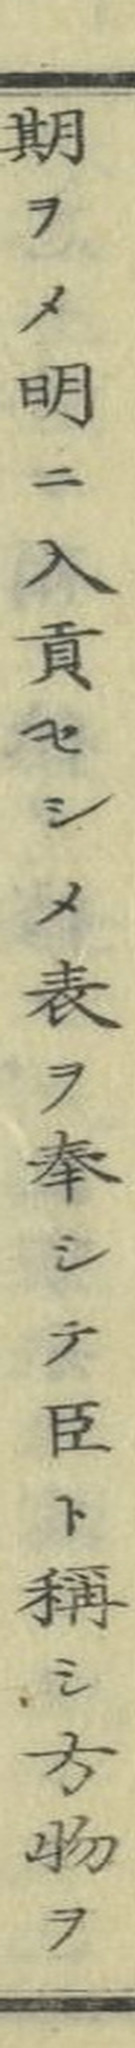期ヲシテ明ニ入貢セシメ表ヲ奉シテ臣ト稱シ方物ヲ
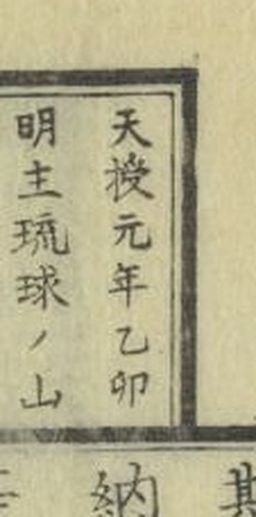天授元年乙卯
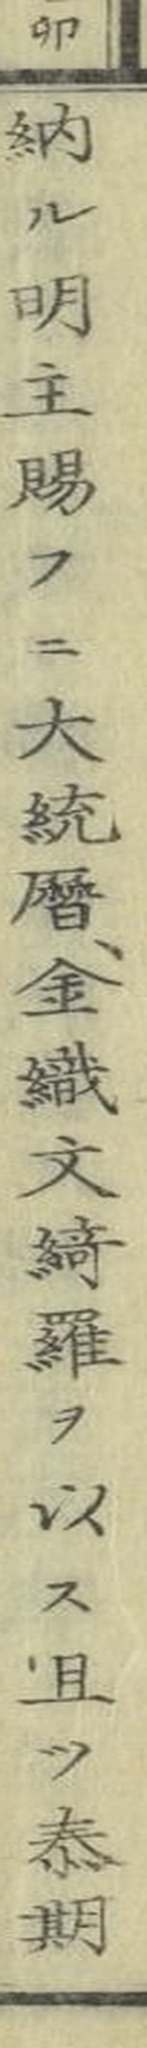納ル明主賜フニ大統曆、金織文綺羅ヲ以ス且ツ泰期
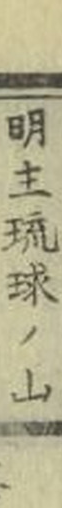明主琉球ノ山
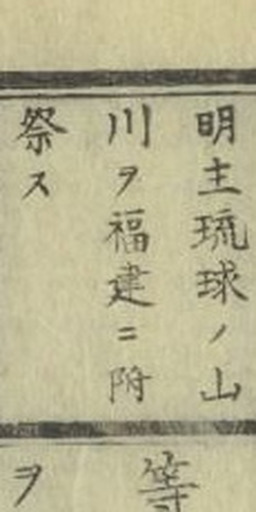川ヲ福建ニ附
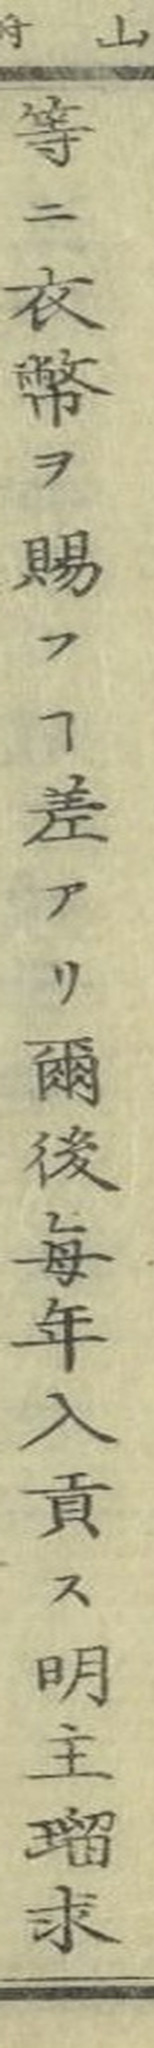等ニ衣幣ヲ賜フコト差アリ爾後每年入貢ス明主瑠求
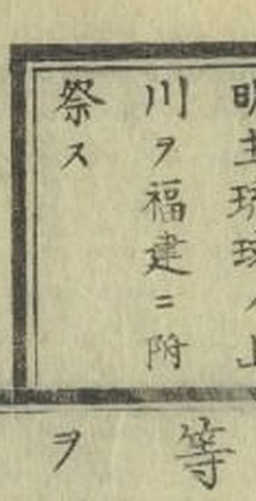川ヲ福建ニ附
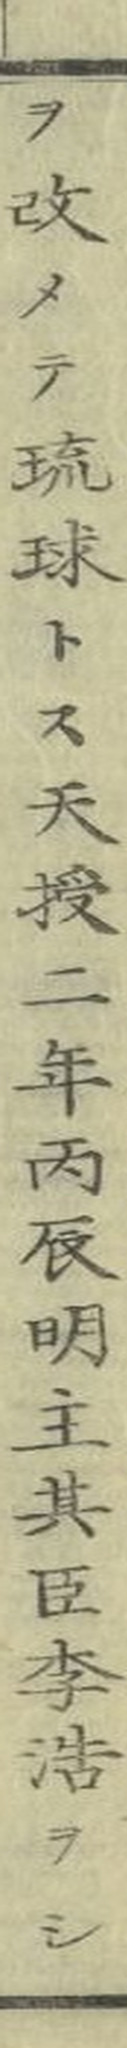ヲ改メテ琉球トス天授二年丙辰明主共臣李浩ヲシ
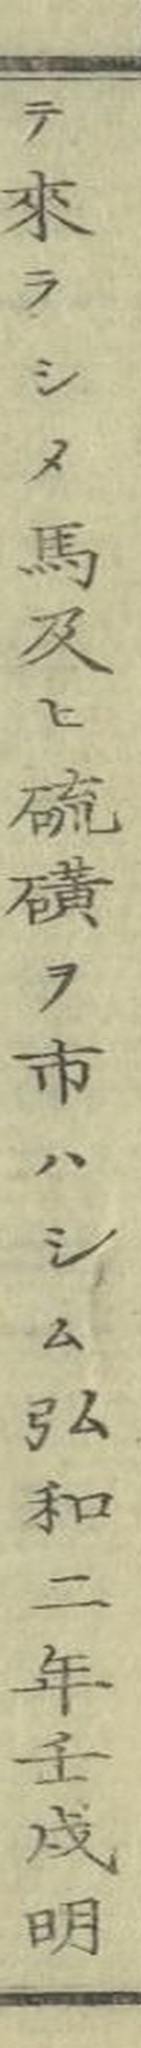テ來ラシメ馬及ヒ硫磺ヲ市ハシム弘和二年壬戌明
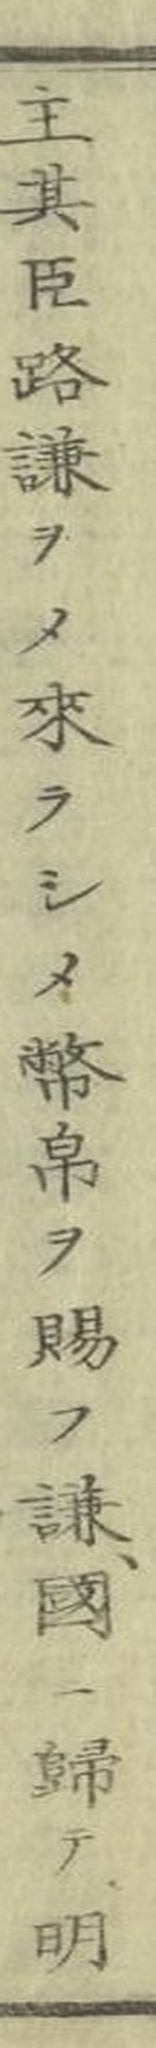主其臣路謙ヲシテ來ラシメ幣帛ヲ賜フ謙、國ニ歸テ明
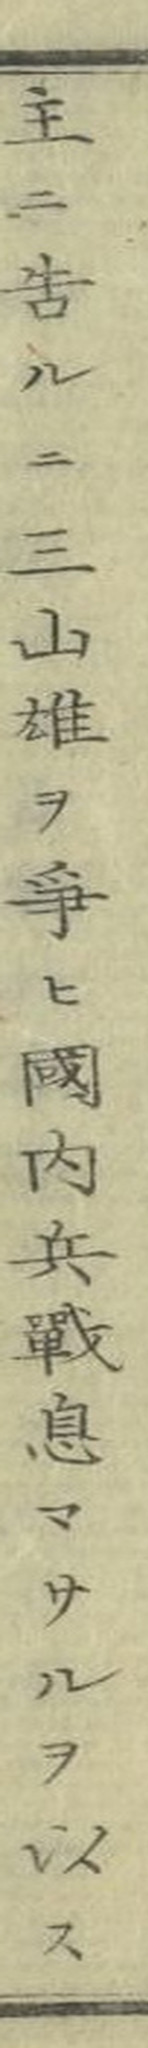主ニ告ルニ三山雄ヲ爭ヒ國內兵戰息マサルヲ以ス
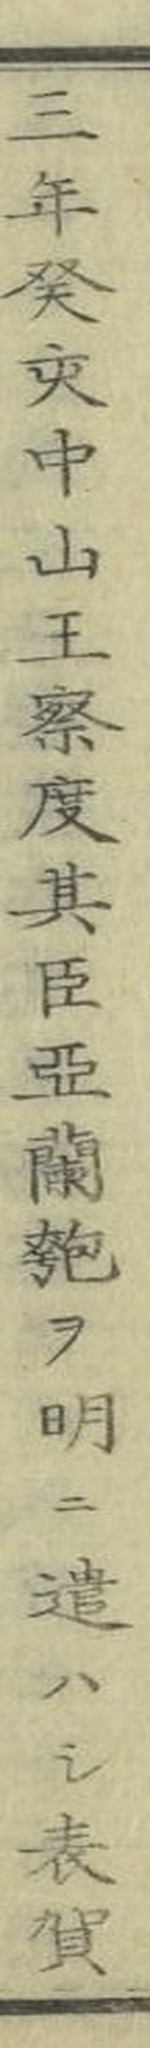三年癸亥中山王察度其臣亞蘭匏ヲ明ニ遣ハシ表賀

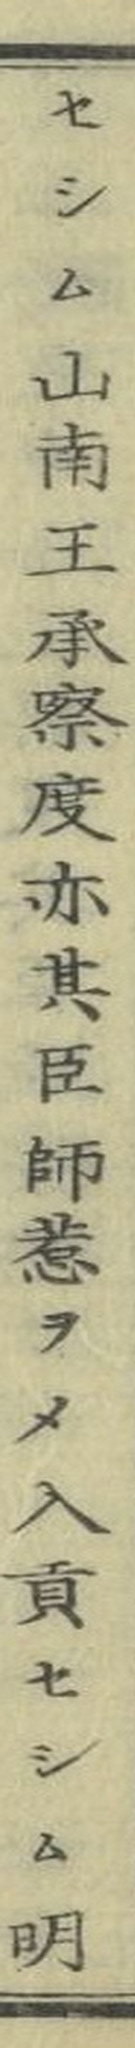セシム山南王承察度亦其臣師惹ヲシテ入貢セシム明
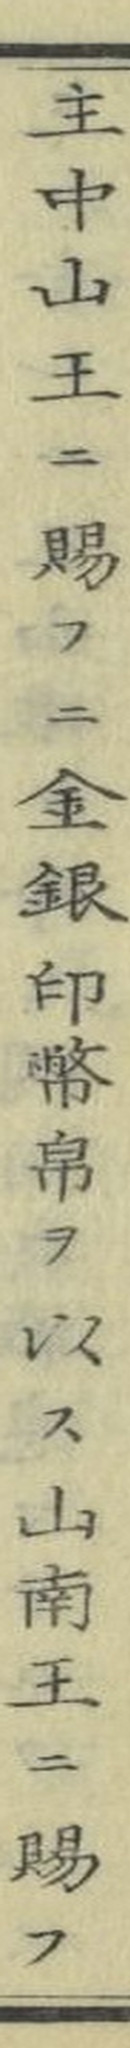主中山王ニ賜フニ金銀印幣帛ヲ以ス山南王ニ賜フ
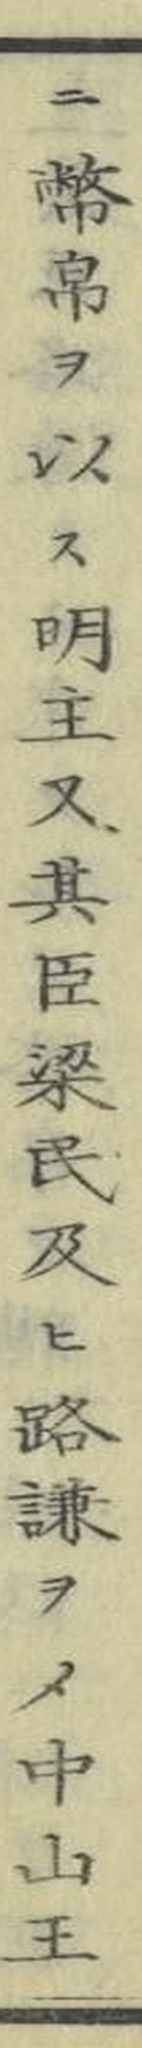ニ幣帛ヲ以ス明主又其臣梁民及ヒ路謙ヲシテ中山王
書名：琉球藩史 一之巻
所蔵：University of the Ryukyus Library
